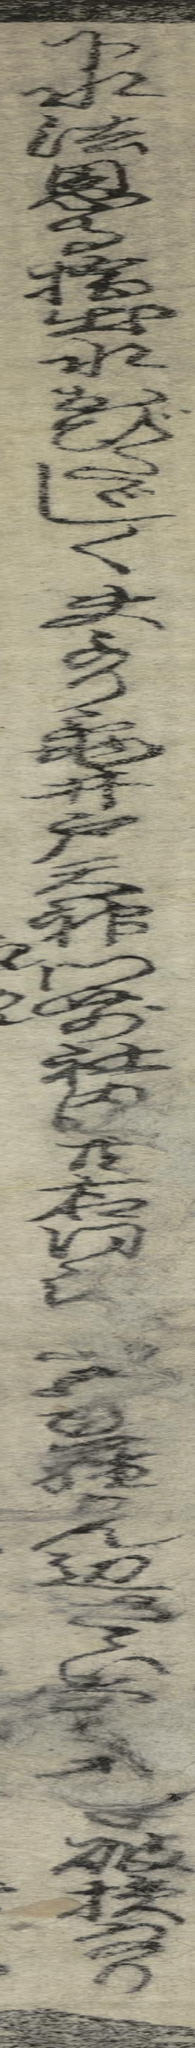下水法恩寺揺出水おびたゞしく夫より亀井戸天神門前社内共右同断五百羅かん辺破損なり
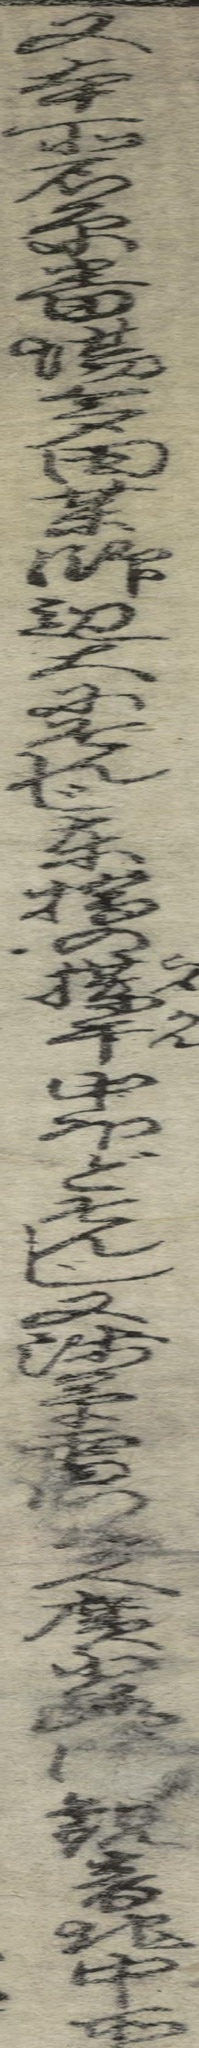又本所石原番場多田薬師辺大にそんじ東端の欄干中ほどそんじ又浅草雷門まへ広小路観音地中所々
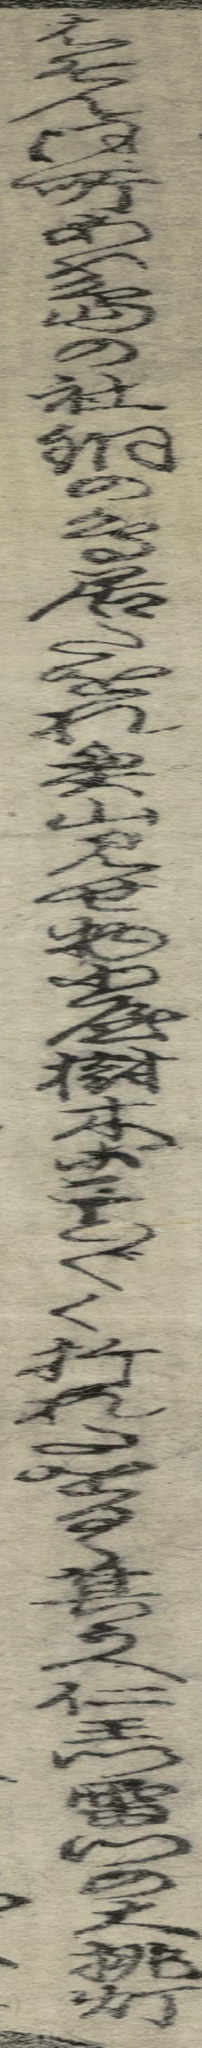はそん同所めい嶋の社銅の鳥居たをれ奥山見せ物小屋樹木等こと〴〵く折れたをるゝ其うへ仁王門雷門の大挑灯
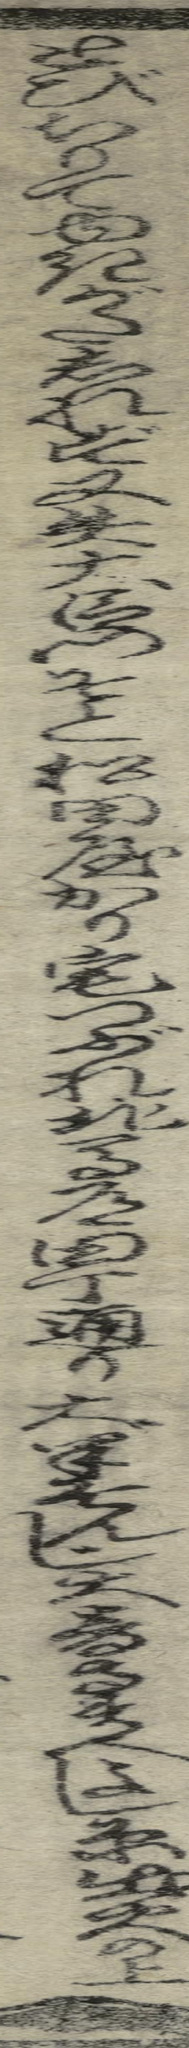とびちりてゆきがたしれず又矢大臣門そと松田屋かり宅つぶれ北馬道田丁通り大半そんじ大音寺まへよし原出火の上
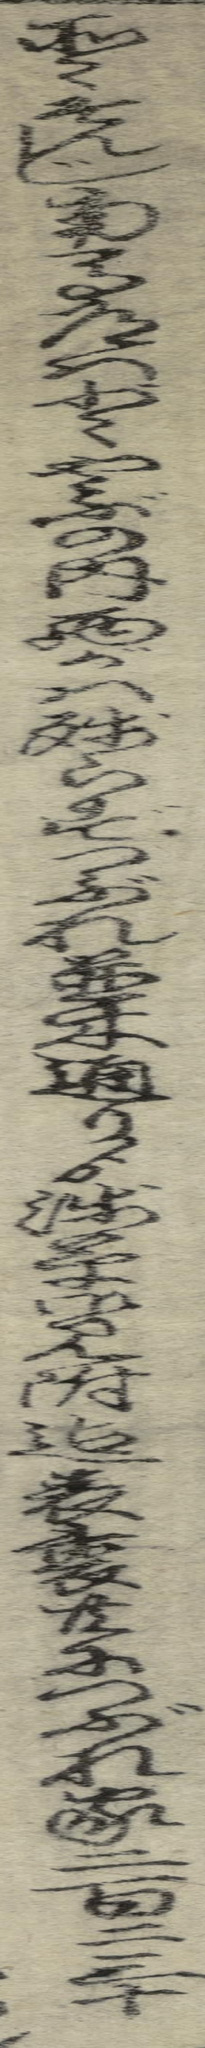所々そんじ南馬道は少々やぶの内西がは残らずつぶれ並木通りゟ浅草御見附迄表裏共につぶれ家二百二三十
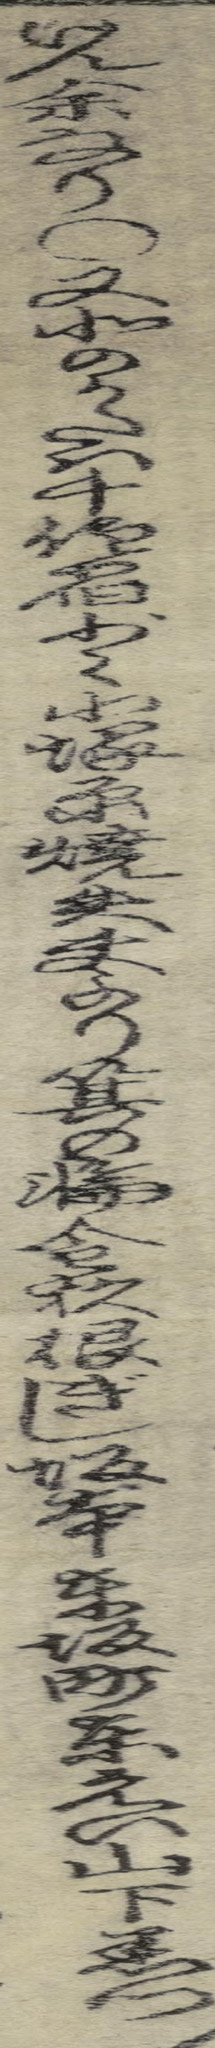けん余なり◯又北のかたは千住宿少々小塚原焼失夫より箕輪金杉根ぎし坂本本坂町東えい山下黒門
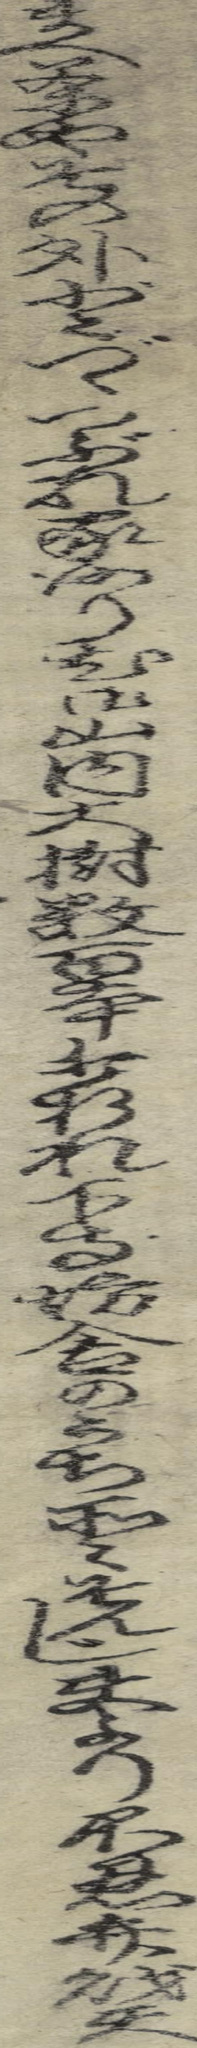まへ茶やその外少々づゝつぶれ家あり尤御山内大樹数百本打折れ下寺坊舎のうち所々そんじ夫より不忍弁財天
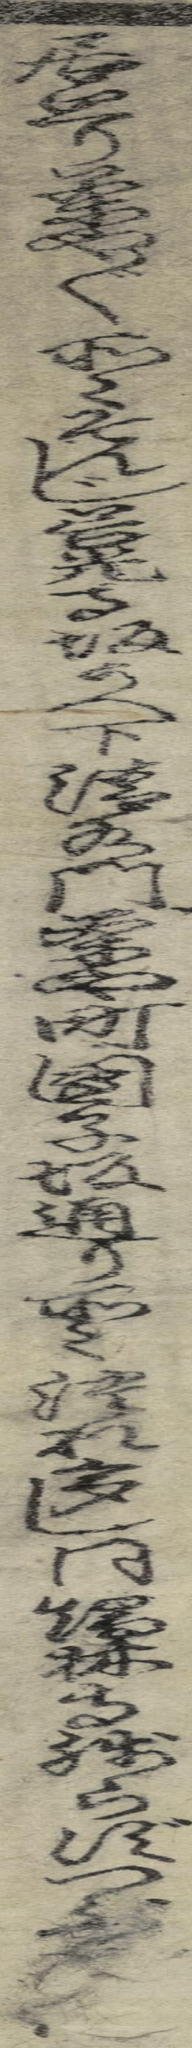居廻り茶や〳〵所々そんじ善光寺坂うへ下有門茶や町団子坂通り所々潰れ多し同瑞林寺残らずつぶれ
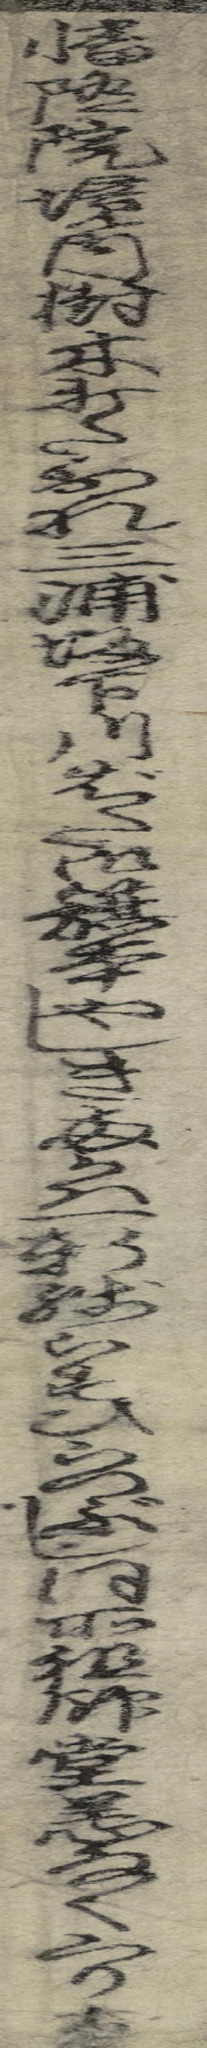潘随院境内樹木打たふれ三浦坂下川はた御簱本やしき兩かは一軒残らずひらつぶし同所祖師堂恙なくくり本堂
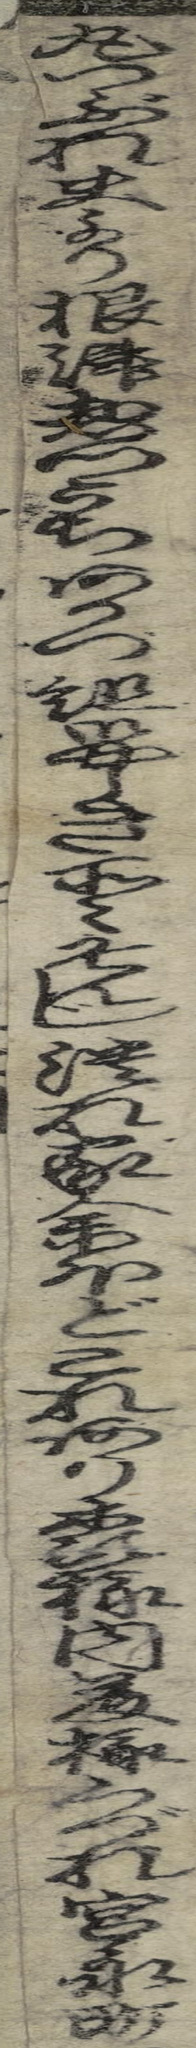丸つぶれ夫より根津惣門うちあかづ組御やしき所々そんじ潰れ家余ほどこれあり森様内藤様くづれ宮永町門前丁
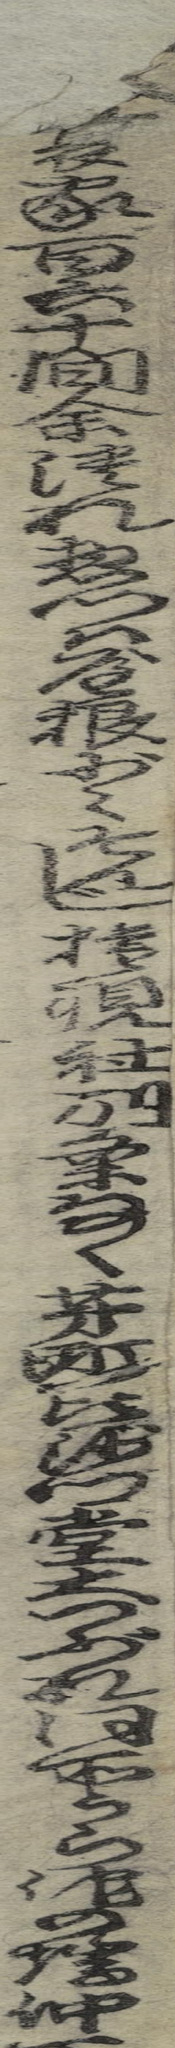家百六十間余潰れ惣門は屋根少々そんじ権現社別条なく茅町毘沙門堂大つぶれ同所うら池の端仲丁
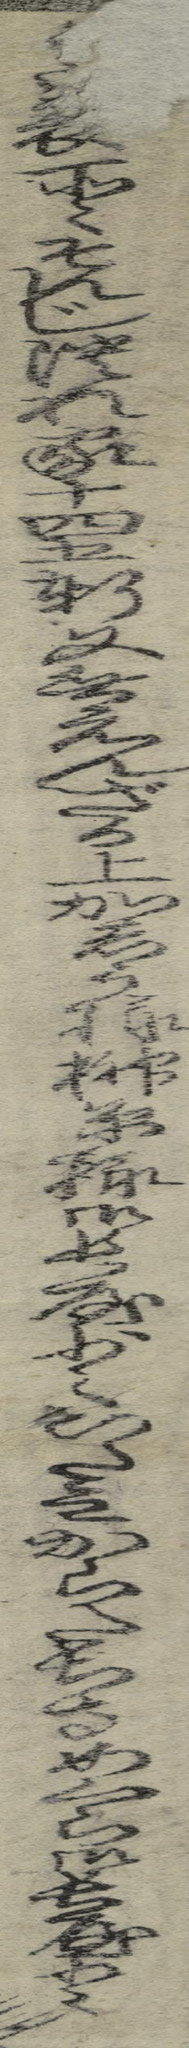うら表所々そんじ潰れ家十四五軒又むえんざか上加しう様榊原様御長屋少々いたみからたち寺めくら御長屋少々
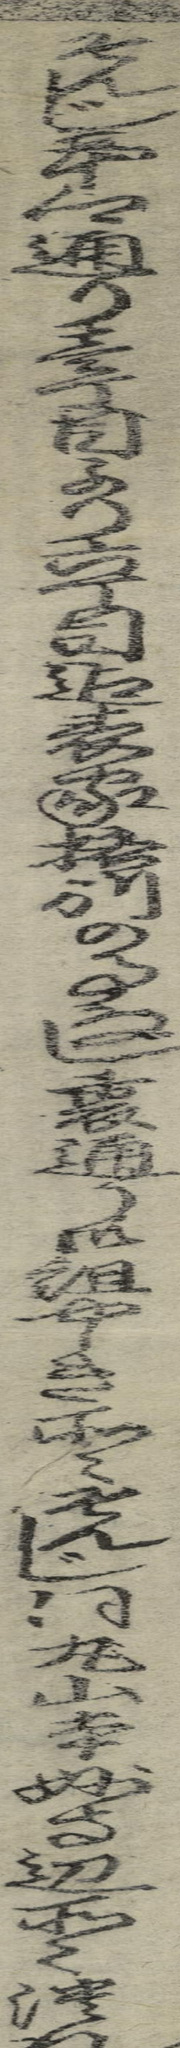そんじ本郷通り壱丁目より六丁目迄表家格別の事なし裏通り御組やしき所々そんじ同丸山本妙寺辺所々潰れ
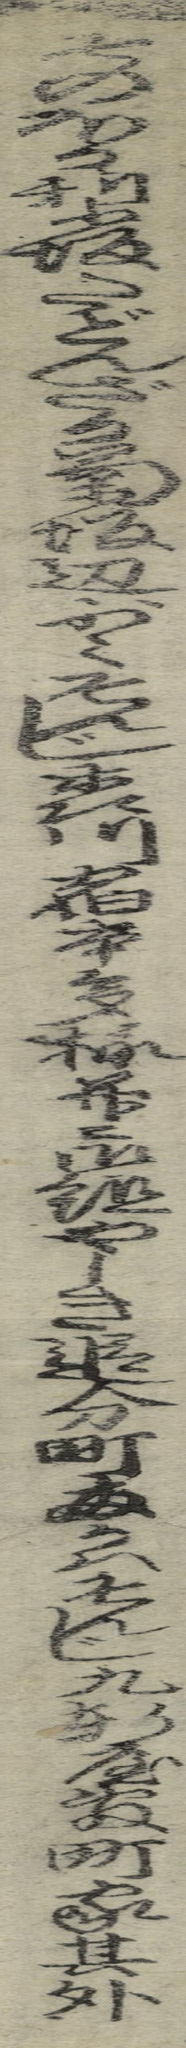そのほか梨坂たどんさか菊坂辺少々そんじ森川宿本多様并に御組やしき追分町兩かはそんじ九軒屋敷町家其外
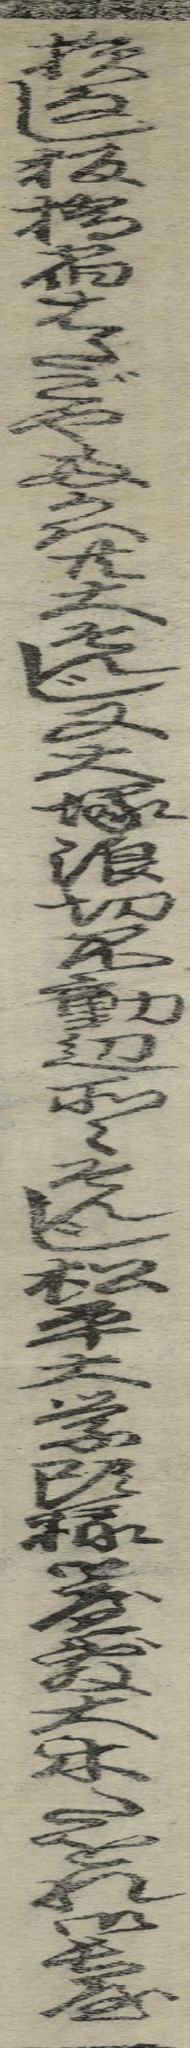損なし板橋宿はたごや兩かは共大そんじ又大塚浪切不動辺所々そんじ松平大学頭様御屋敷大木たをれ御長屋
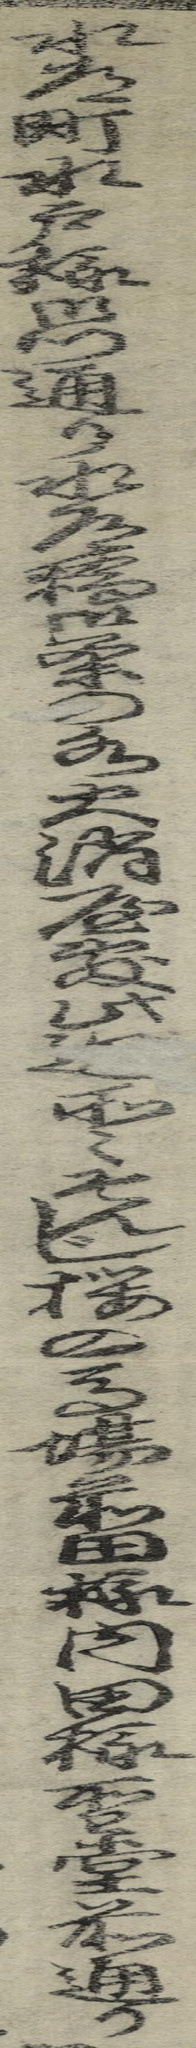水道町水戸様御門通り水道橋御茶の水火消屋敷此辺所々そんじ桜の馬場前田様内田様聖堂前通り
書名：江戸十里四方大風出水焼失　場所附
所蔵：東京大学地震研究所図書室 Earthquake Research Institute Library, The University of Tokyo, JAPAN
